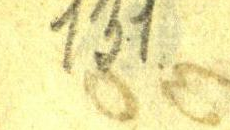131
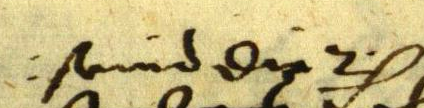:seind die 2:
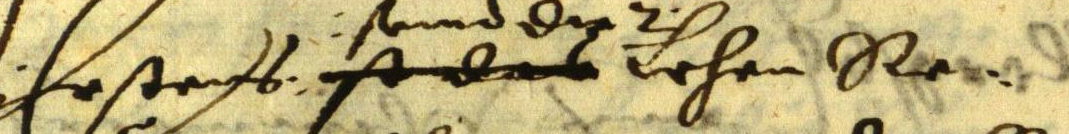Erstens sonders Lehen Re¬
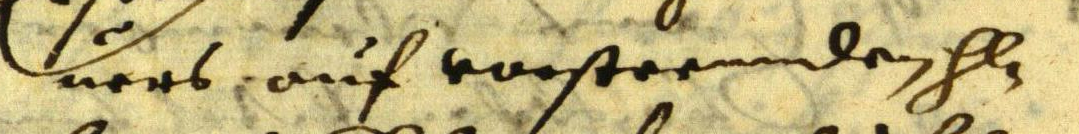ūers aūf vorsteenden hln
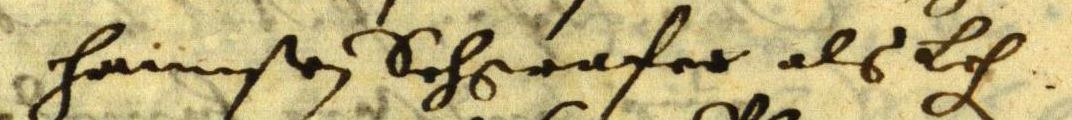hannsen Schgrafer als Leh¬
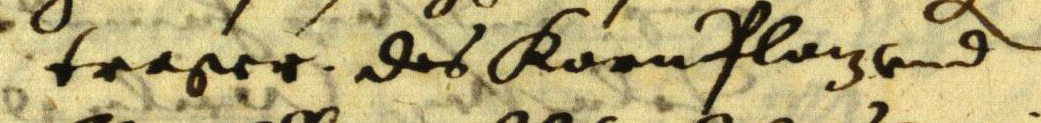trager. des Korn Plaz vnd
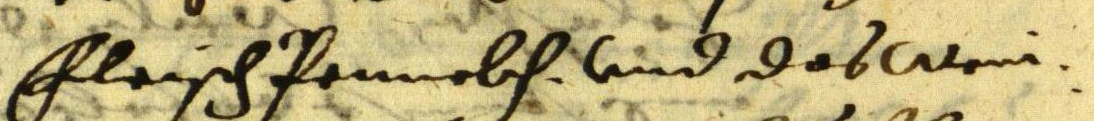Fleisch Pennckh. vnd das Wein¬
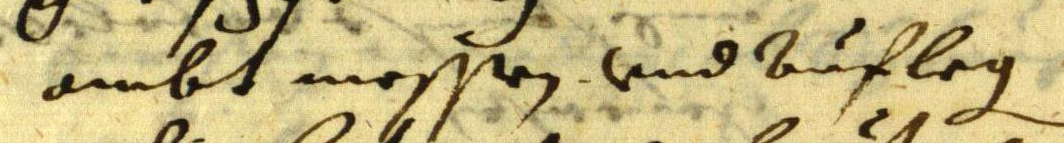ambt messen. vnd Aūfleg
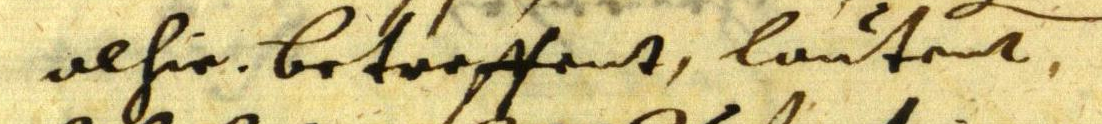alhie. betreffent, laūtent
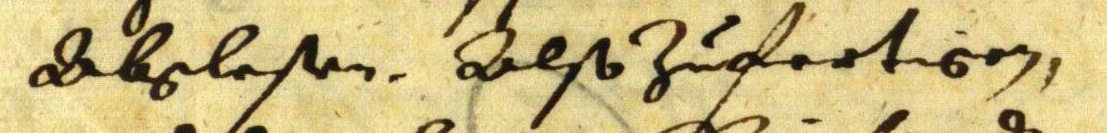Abglesen. Also Zūfertigen,
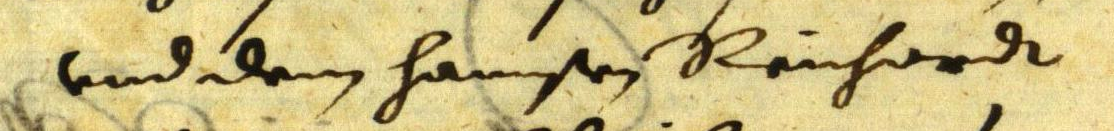vnd dem hannsen Reichardt
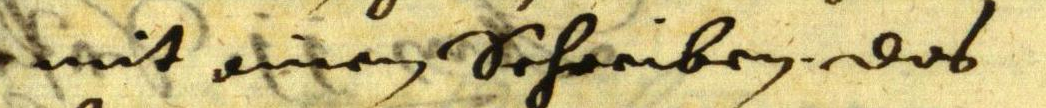mit ainem Schreiben. das
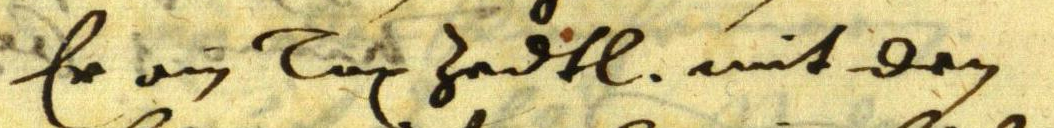Er an Tax Zedtl. mit den
